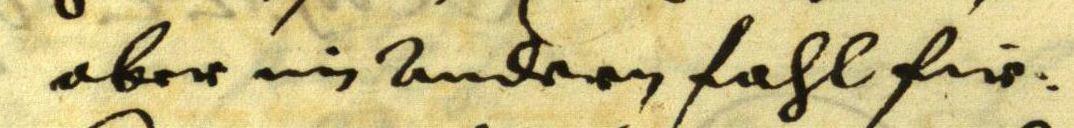aber im Andern fahl fir¬
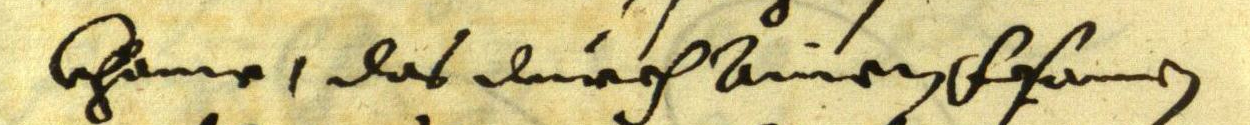khome, das dūrch Ainen Ersamen
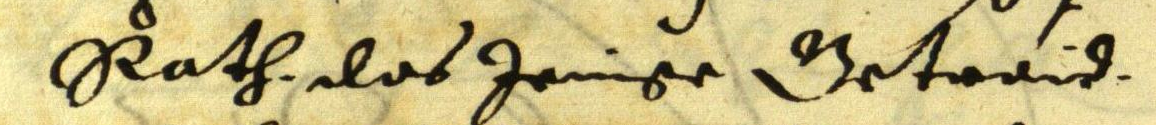Rath. das Jenige Getraid.
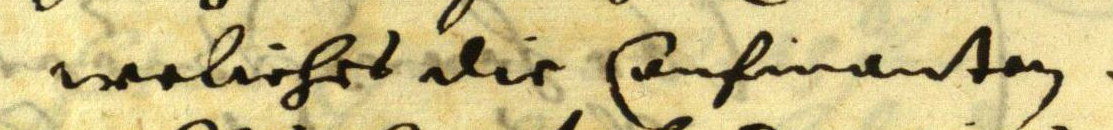weliches die Confinanten.
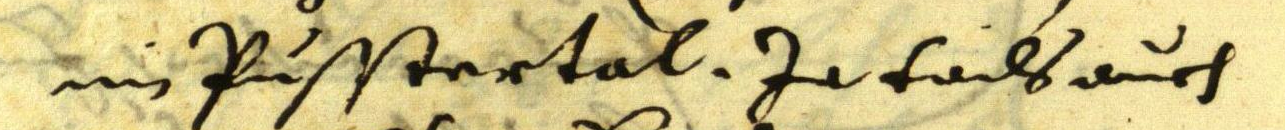im Pūsstertal. Ze tails aūch
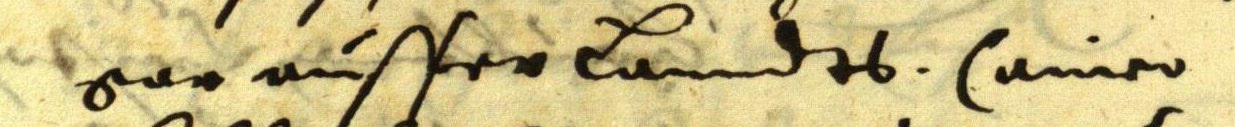gar aūsser Lanndts. (ainer
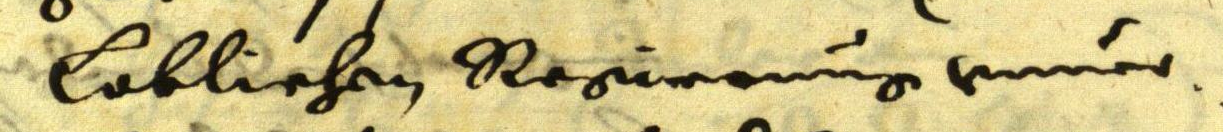Loblichen Regierūng vnūer¬
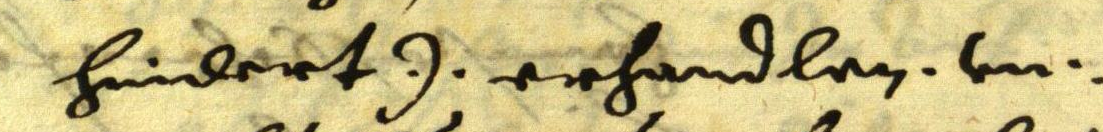hindert.). erhandlen. vn¬
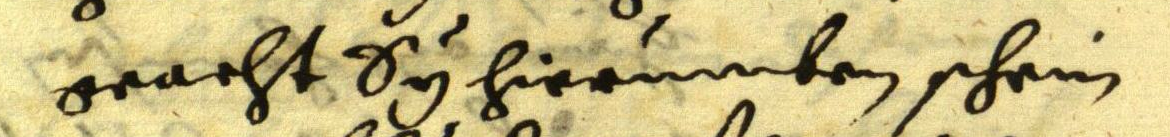geacht Sȳ hierūmben schein
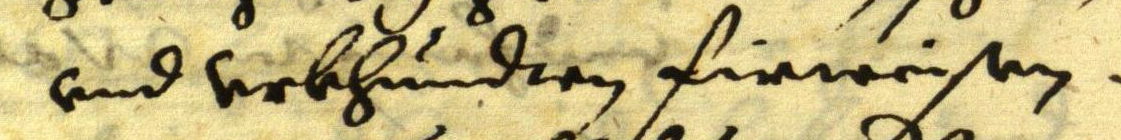vnd vrkhūndten firweisen.
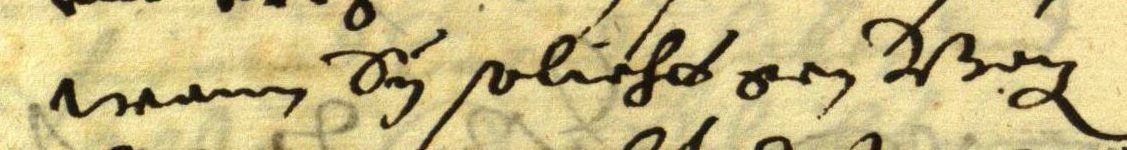wann Sȳ soliches gen Boz
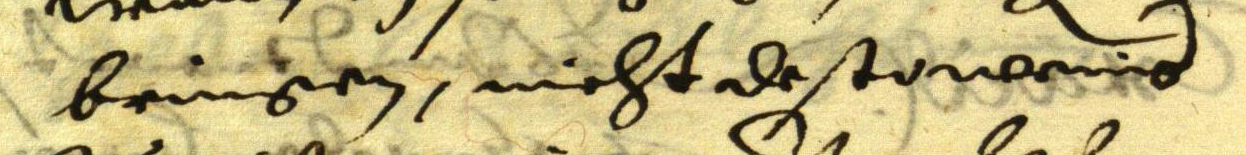bringen, nicht destowenig
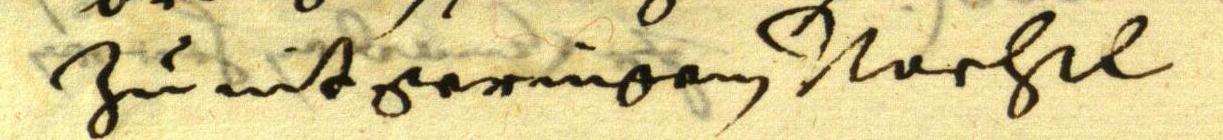Zū nit geringem Nachtl
